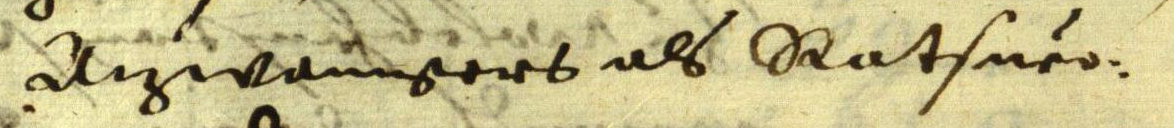Azwangers als Ratsver¬
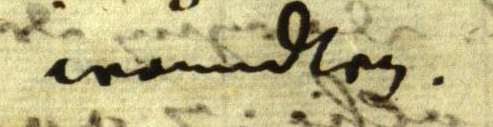wandten.
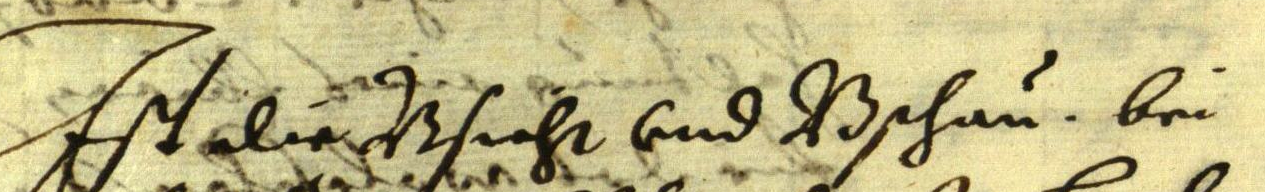Ist die Bsicht vnd Bschaū. bei
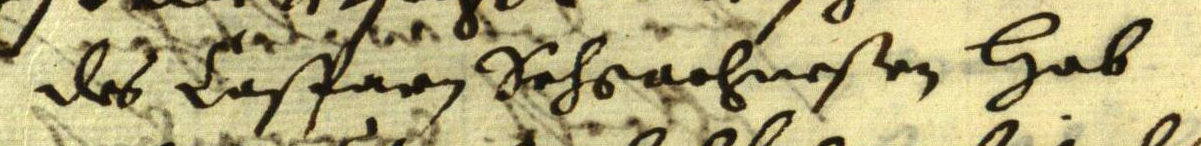des Casparn Schgachnesen Hab
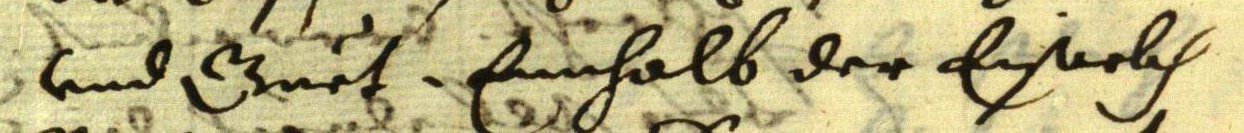vnd Gūet. Ennhalb der Eisackh
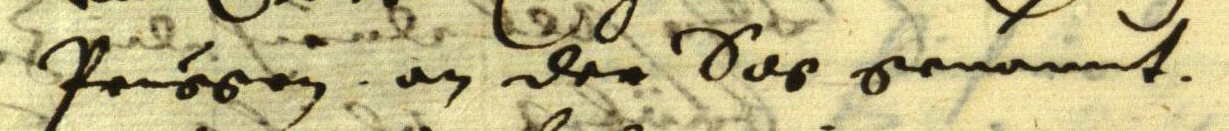Prūggen an der Sag genannt.
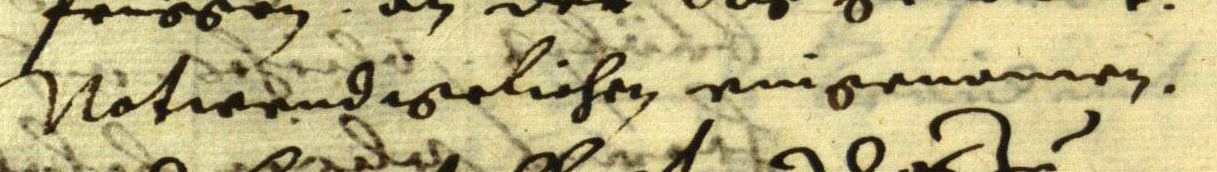Noticend geliehen eingenomen.
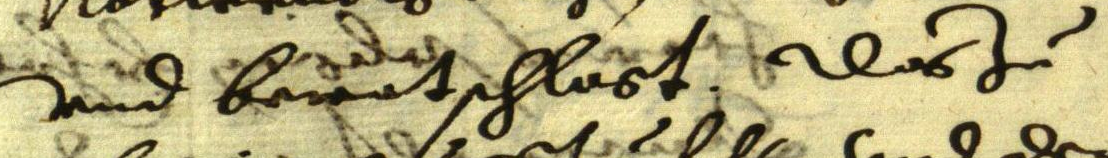vnd beratschlagt. das Zū
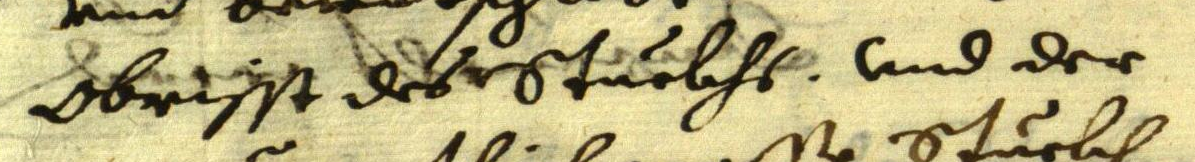Obrisst des Stūckhs. vnd der
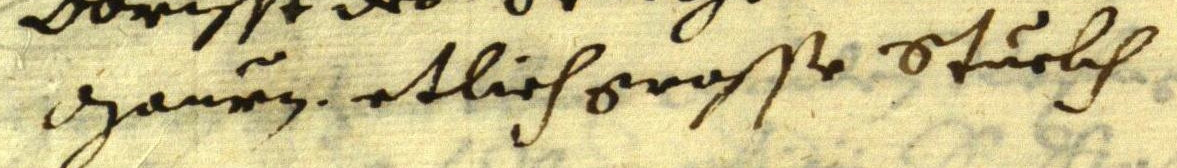Maūrn. eltich grosse Stūckh
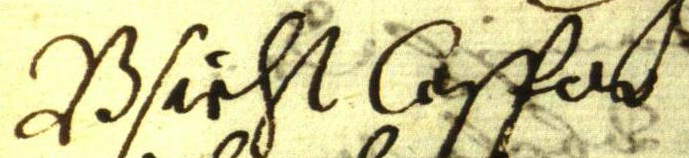Bsicht Caspar
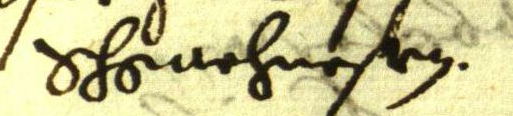Schgachnesen.
